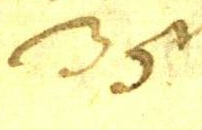35
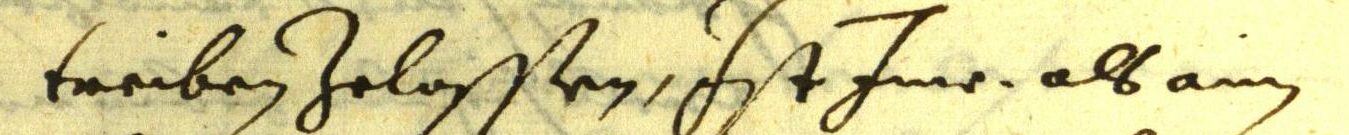treiben Zelassen, Ist Ime. als aim
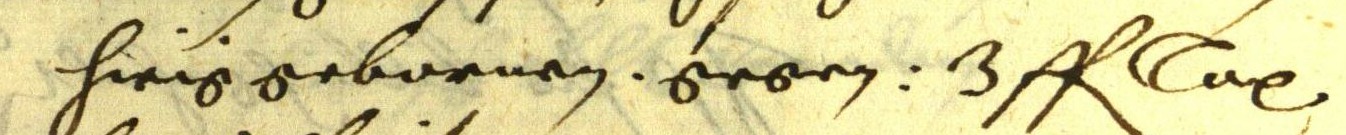hieig gebornen. gegen: 3 fl Tax
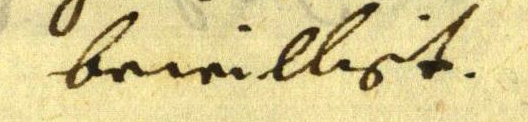bewilligt.
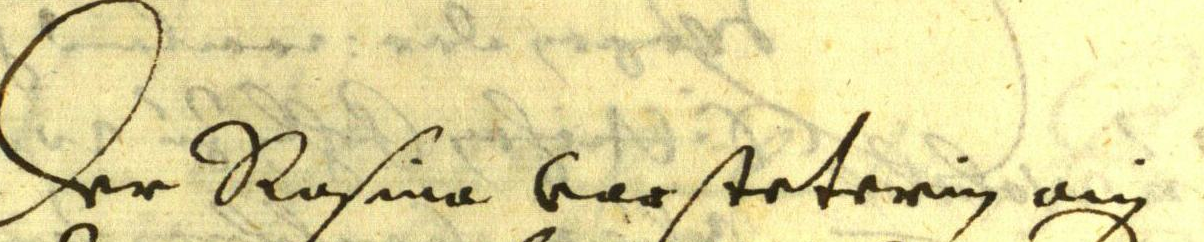Der Rosina Vorsteterin ain
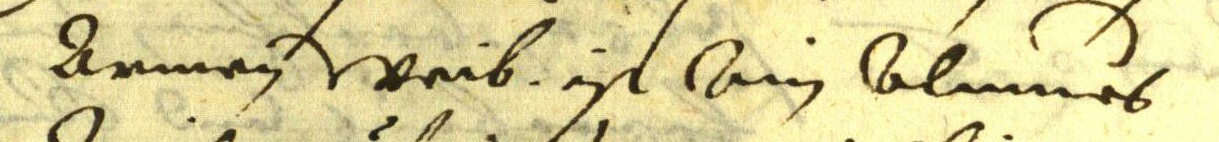Armen Weib. ist Ain Almūes
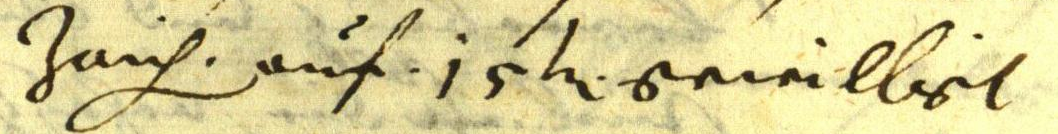Zaich. aūf. 15 k. gewilligt.
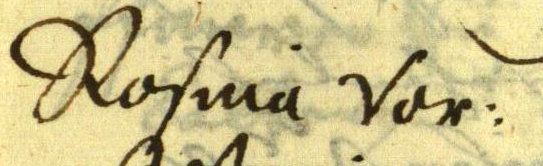Rosina Vor¬
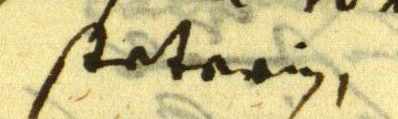steterin,
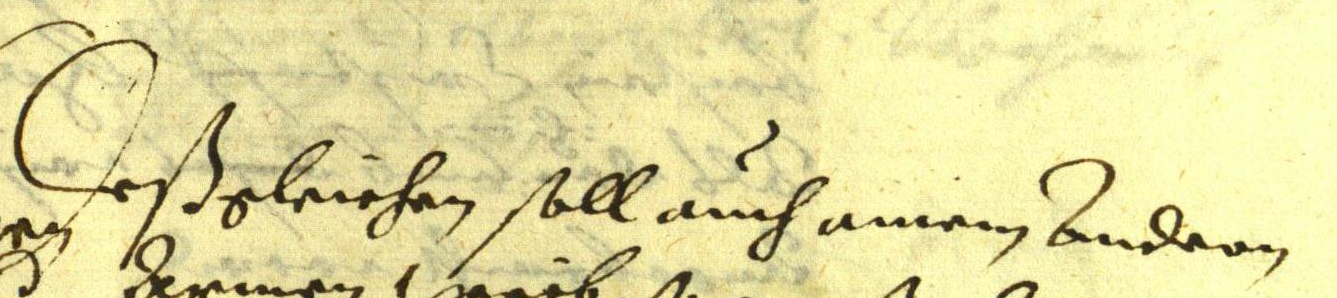Dessgleichen soll aūch ainem Andern
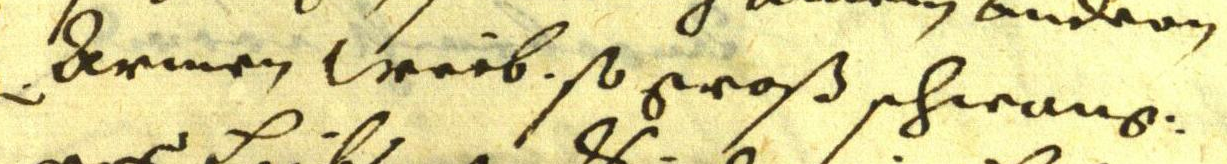Armen Weib. so groß schwang¬
